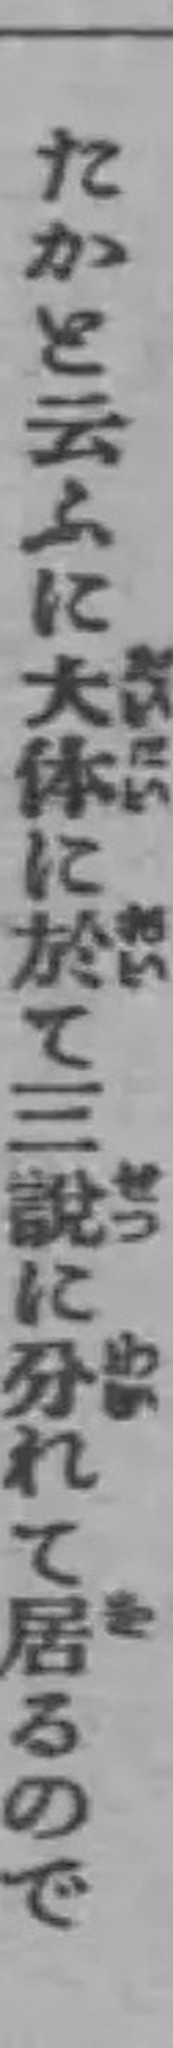たかと云ふに大体に於て三説に分れて居るので
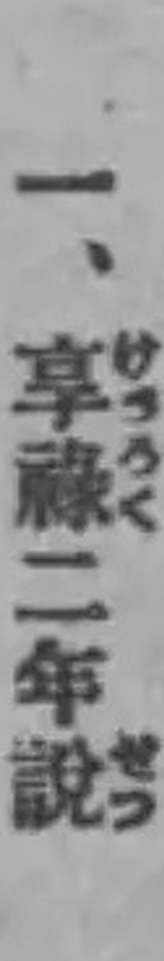一、享禄二年説
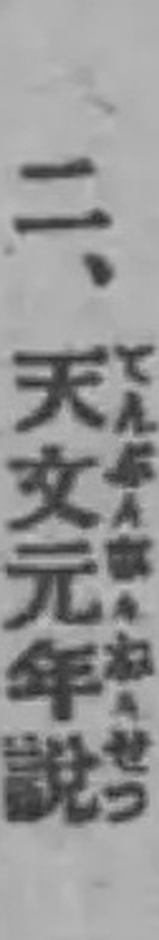二、天文元年説
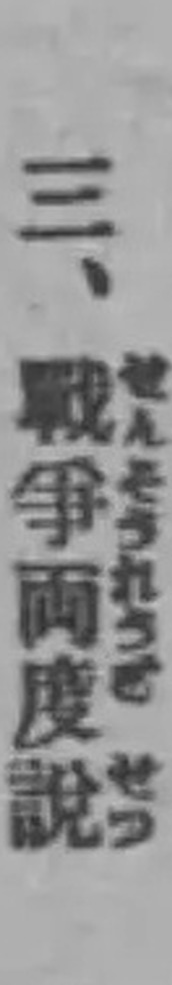三、戦争両度説
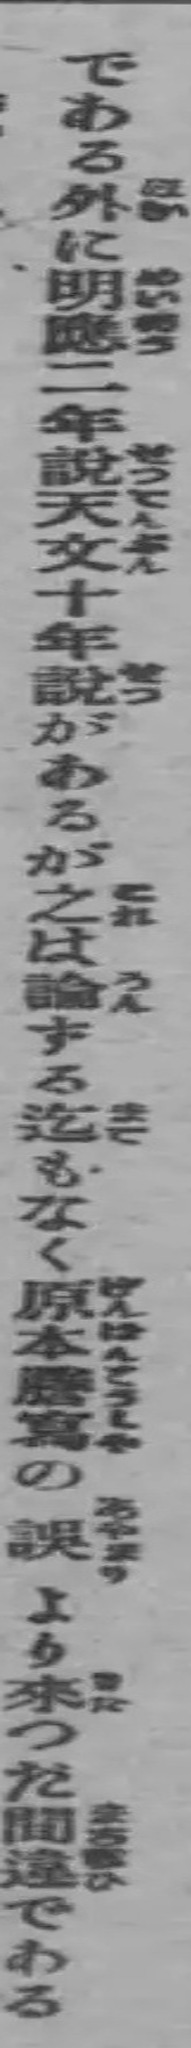である外に明応二年説天文十年説があるが之は論ずる迄もなく原本謄写の誤より来つた間違である
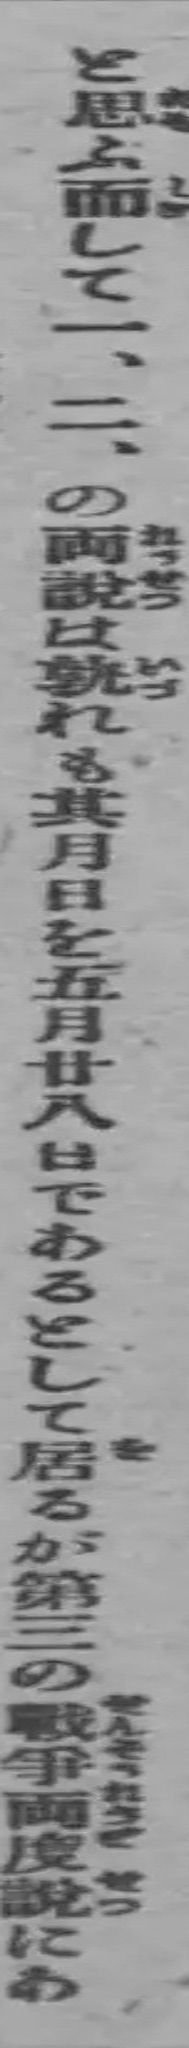と思ふ而して一、二、の両説は孰れも其月日を五月廿八日であるとして居るが第三の戦争両度説にあ
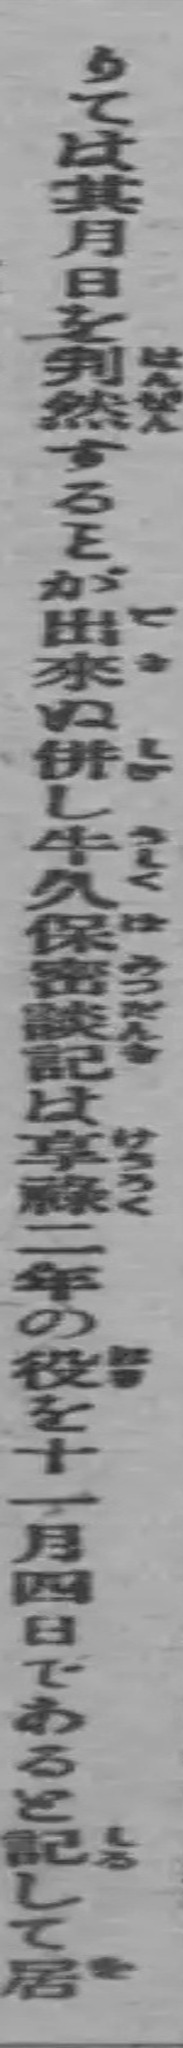りては其月日を判然することが出来ぬ併し牛久保密談記は享禄二年の役を十一月四日であると記して居
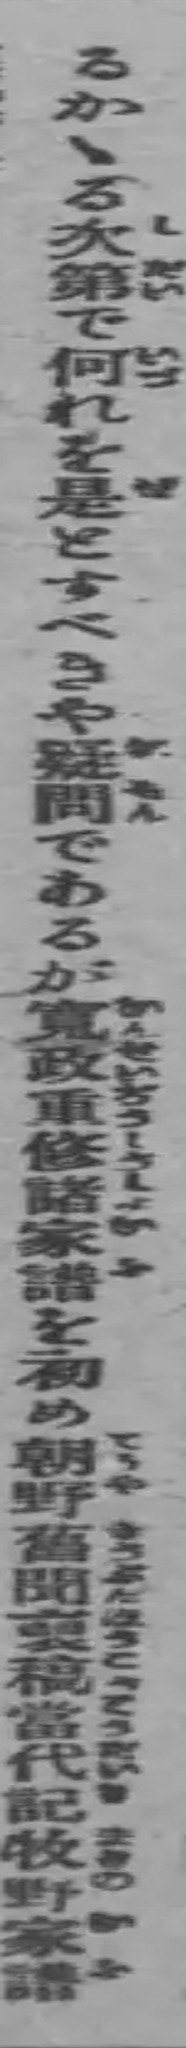るかゝる次第で何れを是とすべきや疑問であるが寛政重修諸家譜を初め朝野旧聞裒稿当代記牧野家譜
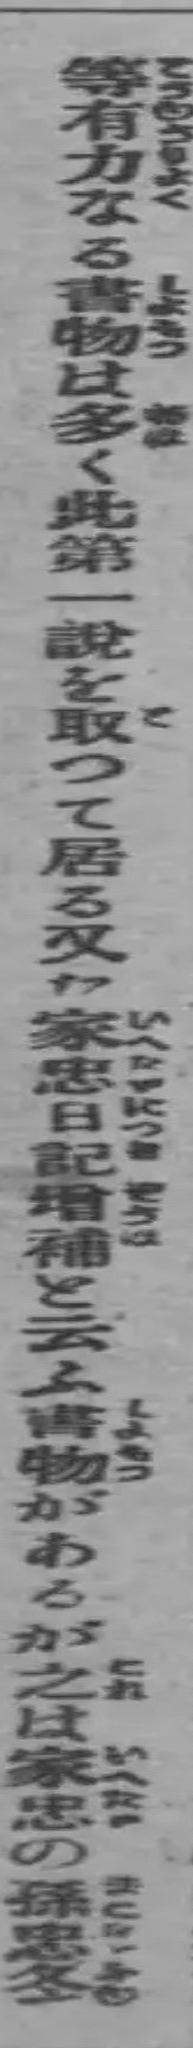等有力なる書物は多く此第一説を取つて居る又た家忠日記増補と云ふ書物があるが之は家忠の孫忠冬

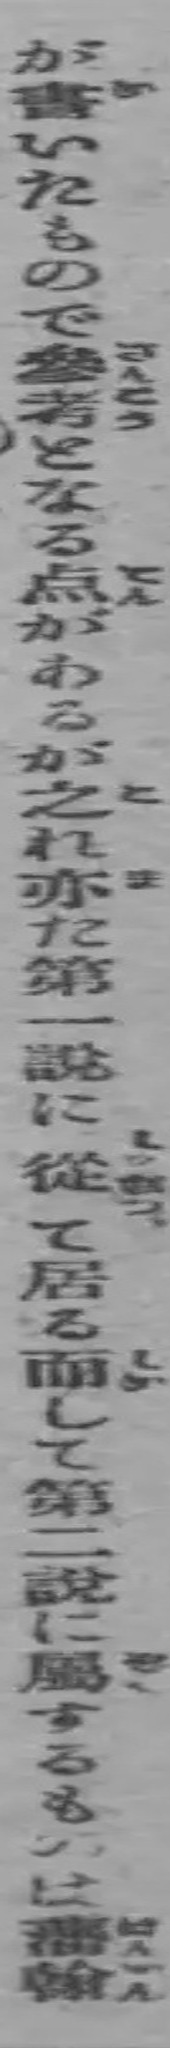が書いたもので参考となる点があるが之れ亦た第一説に従て居る而して第二説に属するものは藩翰
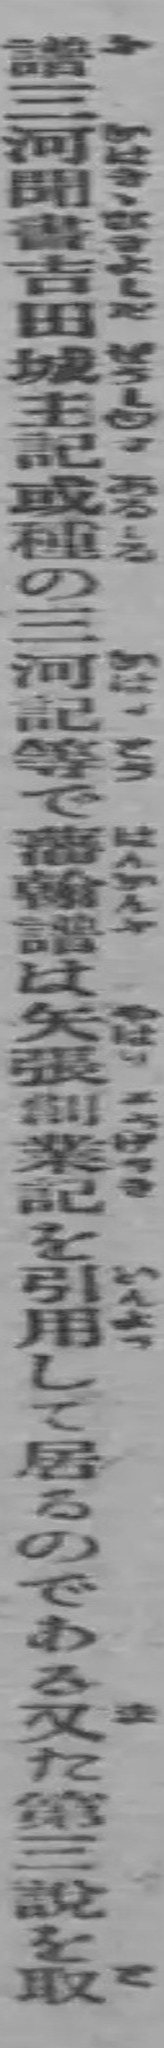譜三河聞書吉田城主記或種の三河記等で藩翰譜は矢張創業記を引用して居るのである又た第三説を取
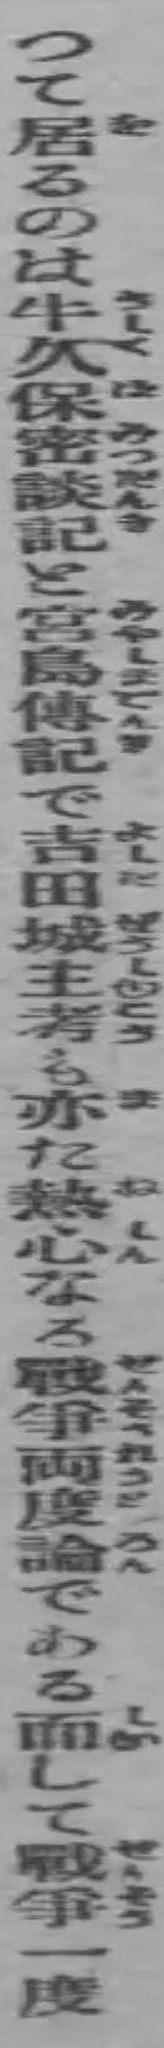つて居るのは牛久保密談記と宮島伝記で吉田城主考も亦た熱心なる戦争両度論である而して戦争一度
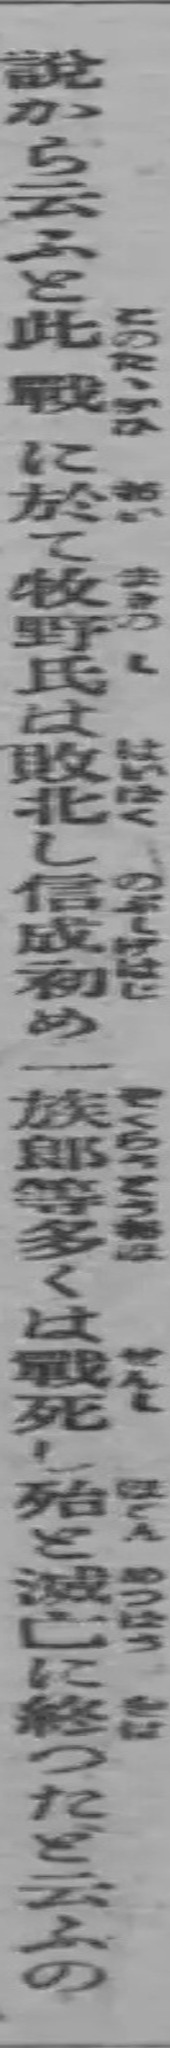説から云ふと此戦に於て牧野氏は敗北し信成初め一族郎等多くは戦死し殆ど滅亡に終つたと云ふの
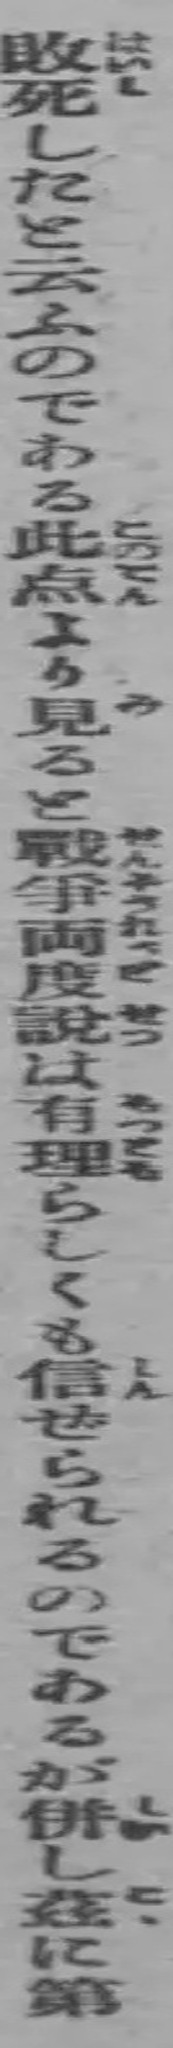証拠敗死したと云ふのである此点より見ると戦争両度説は有理らしくも信ぜられるのであるが併し茲に第
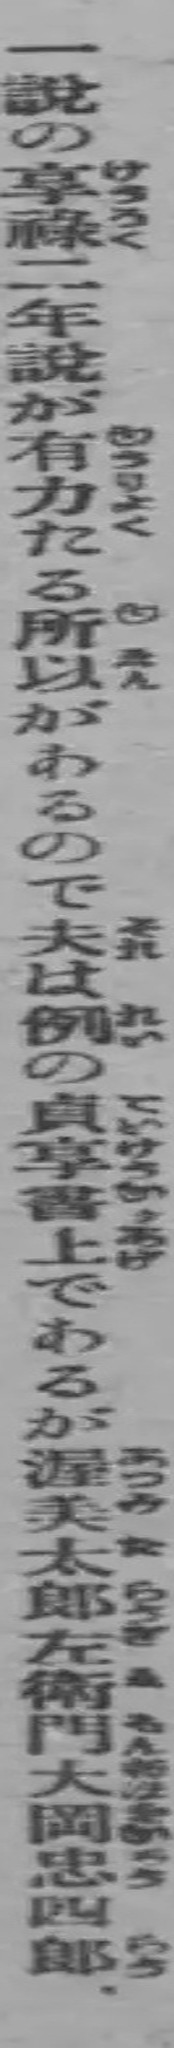一説の享禄二年説が有力たる所以があるので夫は例の貞享書上であるが渥美太郎左衛門大岡忠四郎、
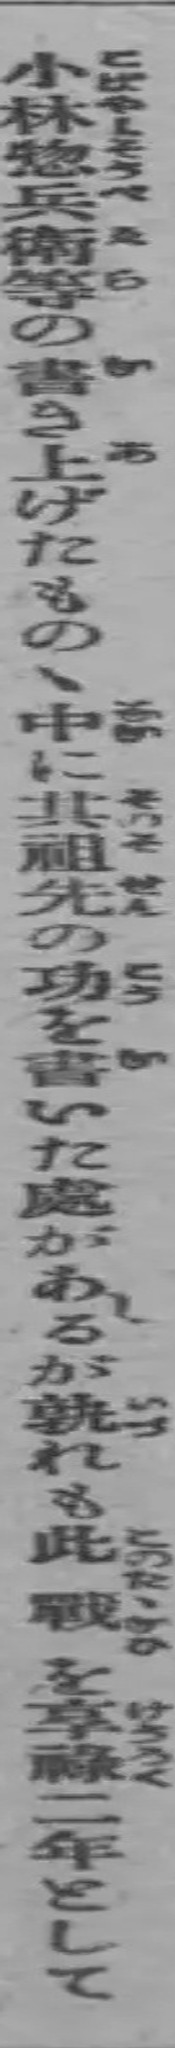小林惣兵衛等の書上げたものゝ中に其祖先の功を書いた処があるが孰れも此戦を享禄二年として
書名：豊橋市史談
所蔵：国立国会図書館 National Diet Library, JAPAN
